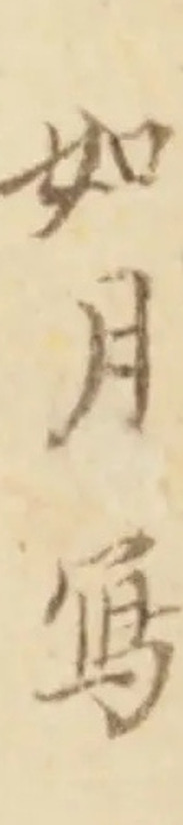如月写
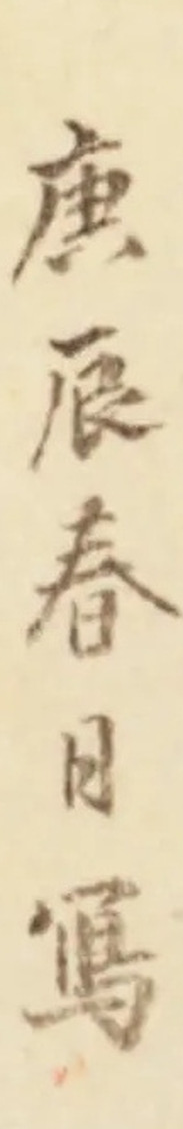庚辰春日写
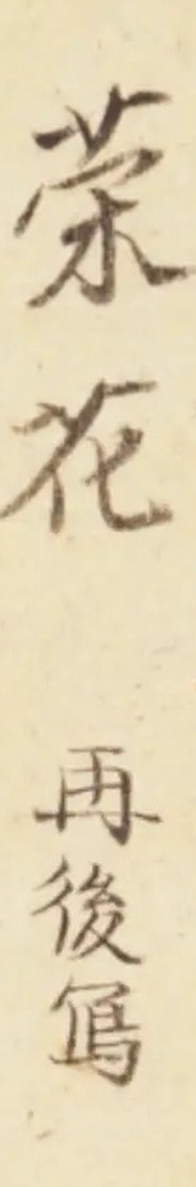栄花再後写
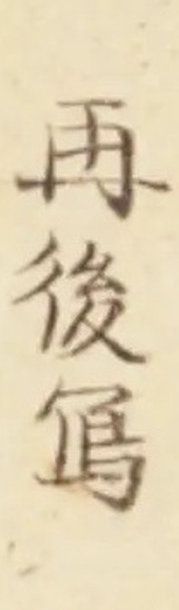再後写
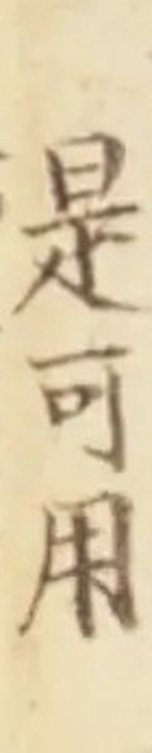是可用
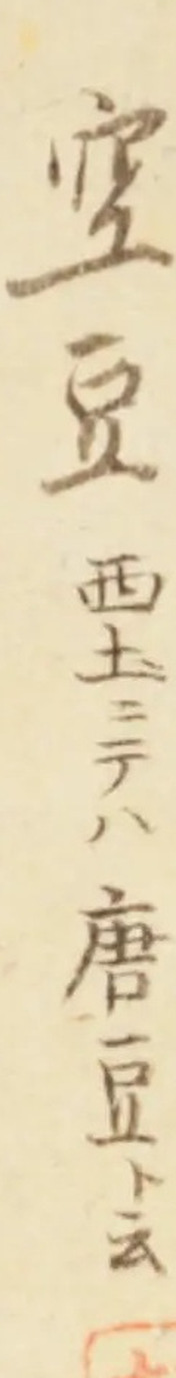空豆西土ニテハ唐豆ト云
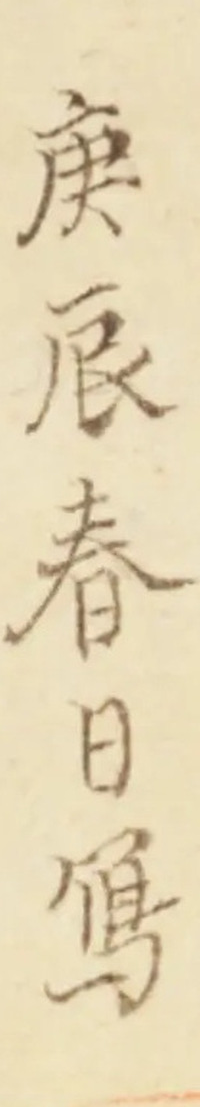庚辰春日写
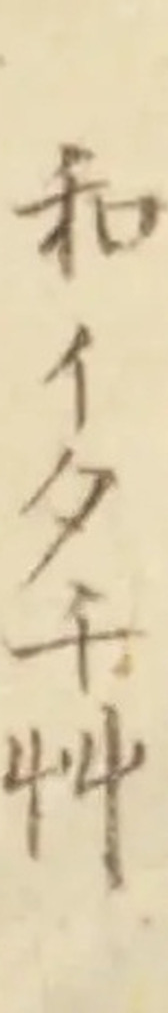和イタチ艸
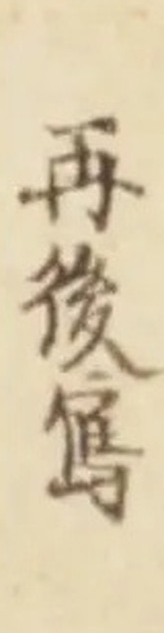再後写

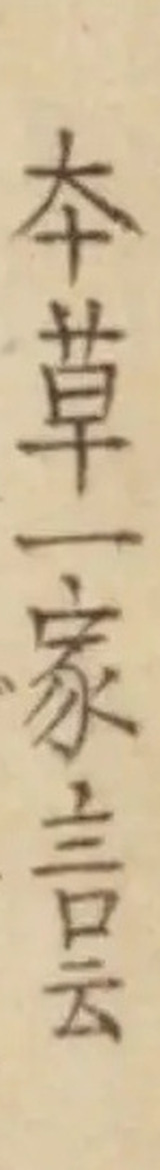本草一家言云
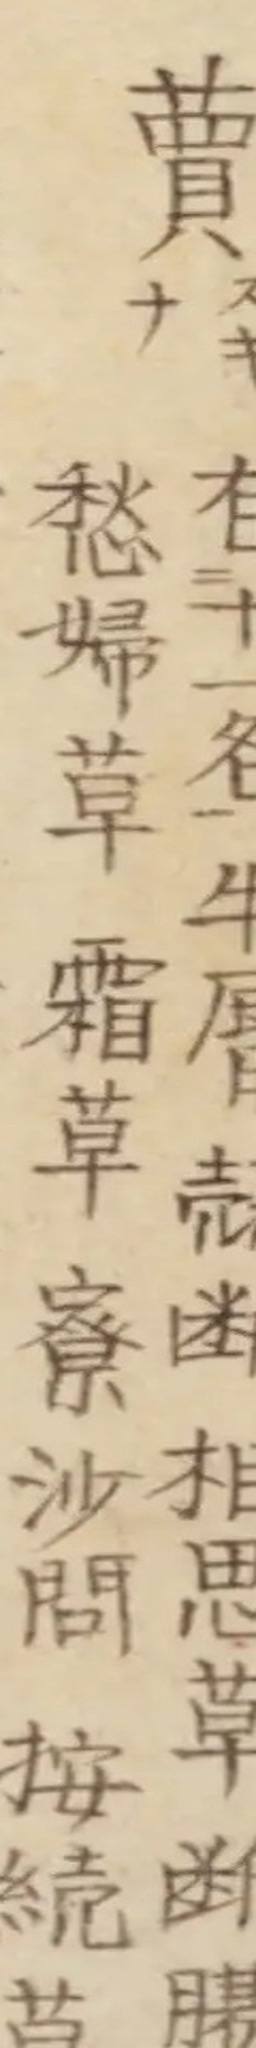愁婦草霜草寮沙問按続草
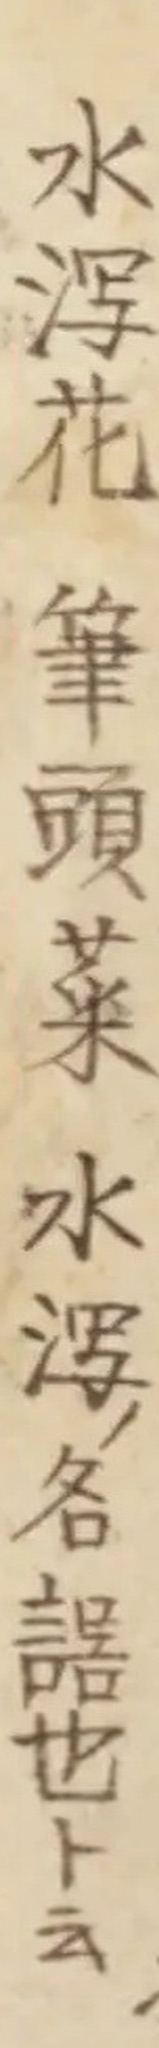水瀉花筆頭菜水瀉名誤也ト云
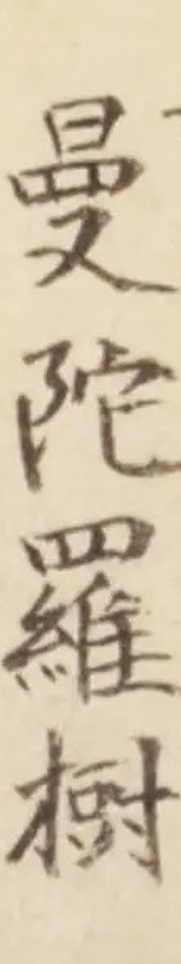曼荼羅樹
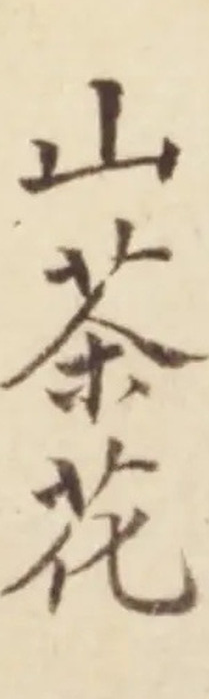山茶花
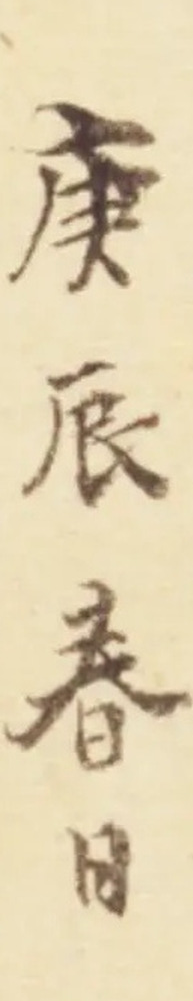庚辰春日
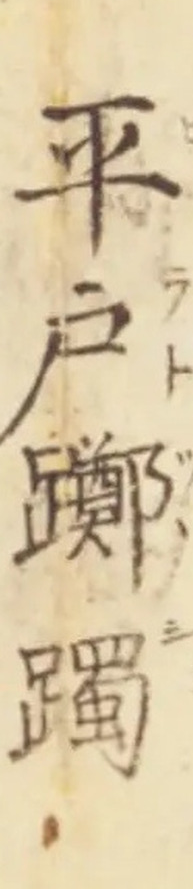平戸躑躅
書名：梅園草木花譜春之部. 1
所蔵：国立国会図書館 National Diet Library, JAPAN
